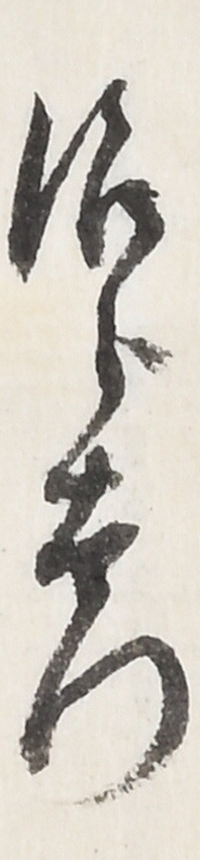治郎右衛門
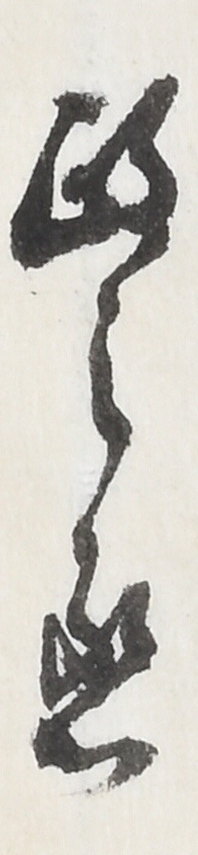政之丞
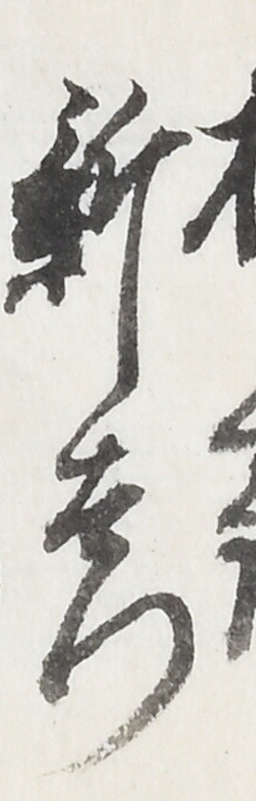新右衛門
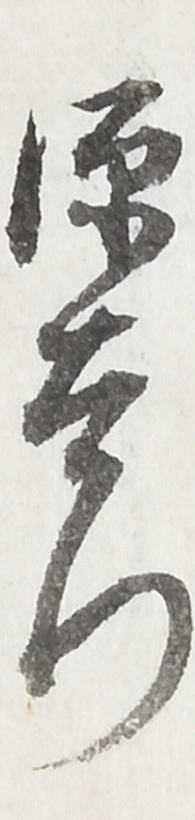源右衛門
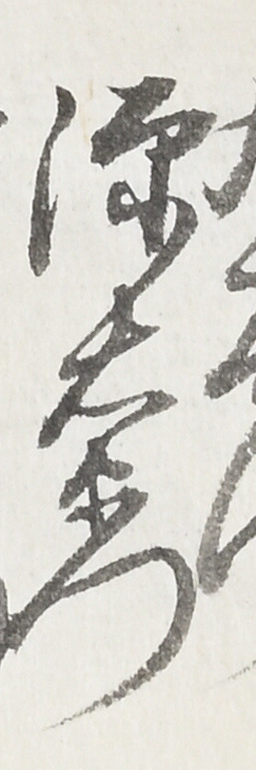源右衛門
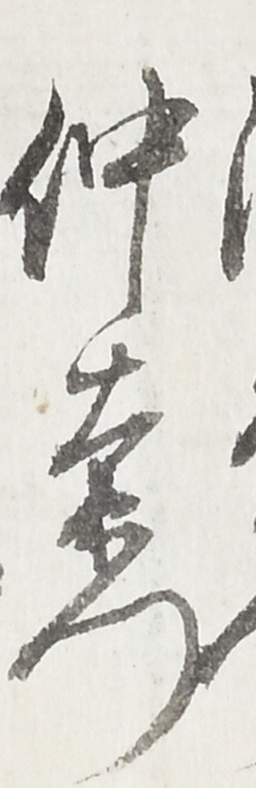仲右衛門
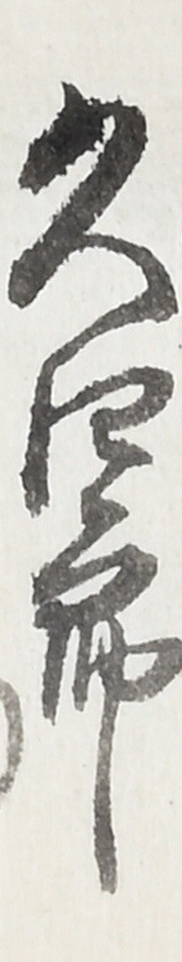久四郎
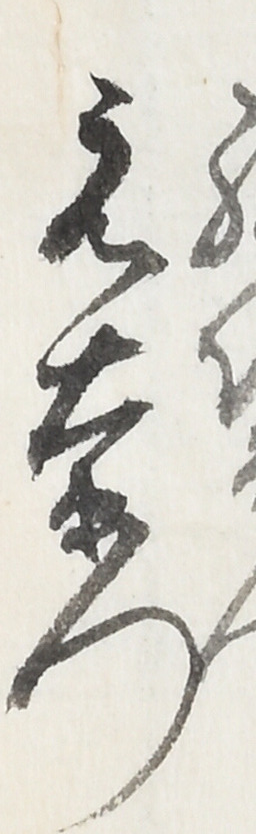元右衛門

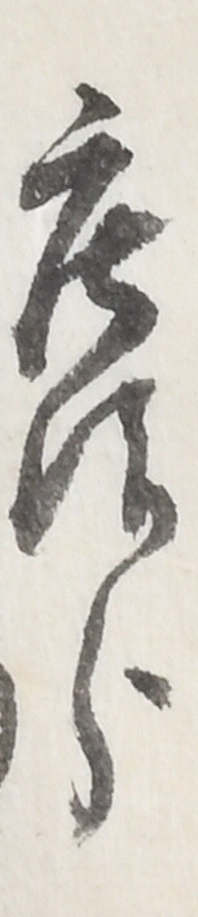庄治郎
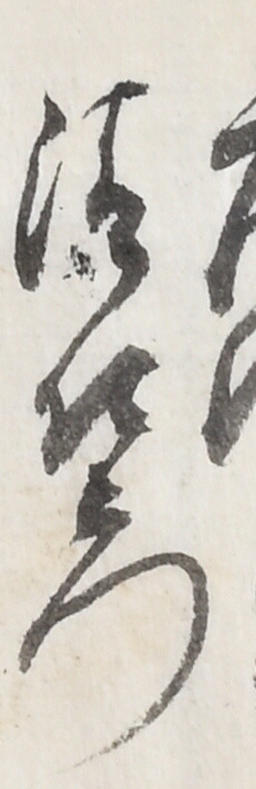清左衛門
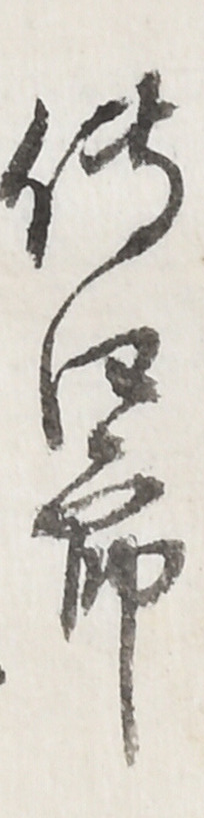伝四郎
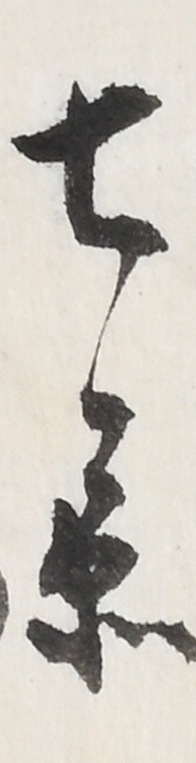七兵衛
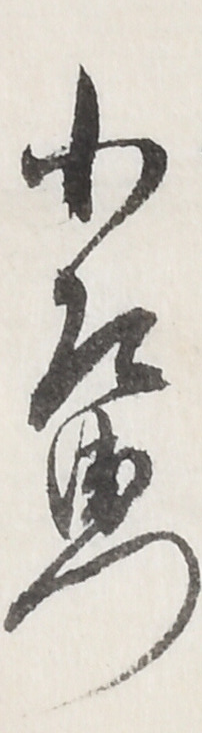小左衛門
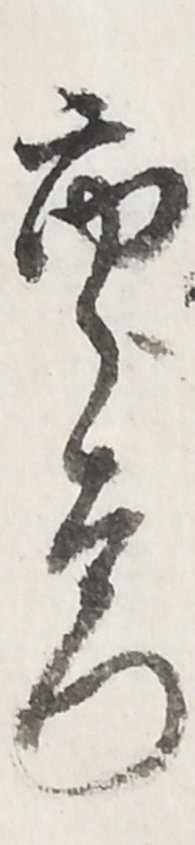市郎右衛門
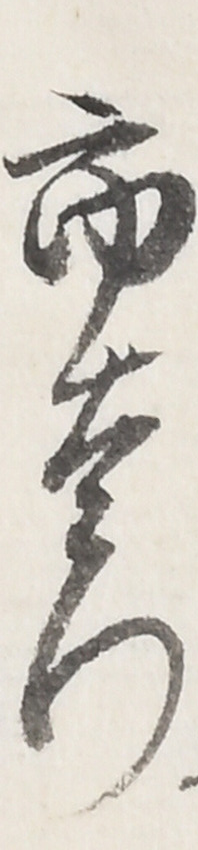市右衛門
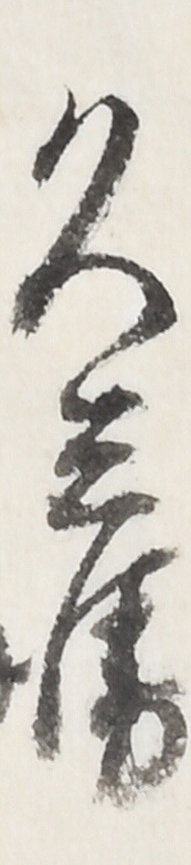久兵衛
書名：御拝地百五拾年御祝儀献上御目録名前
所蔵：伊那市立高遠町図書館・合同会社AMANE
